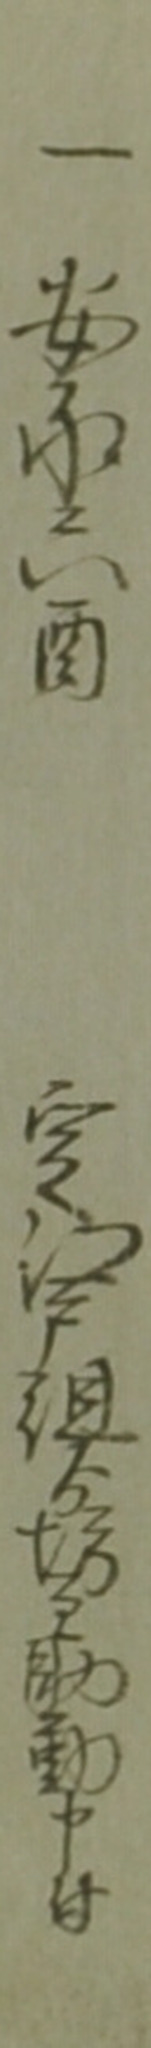一安永六酉定江戸組ゟ坊主助勤申付
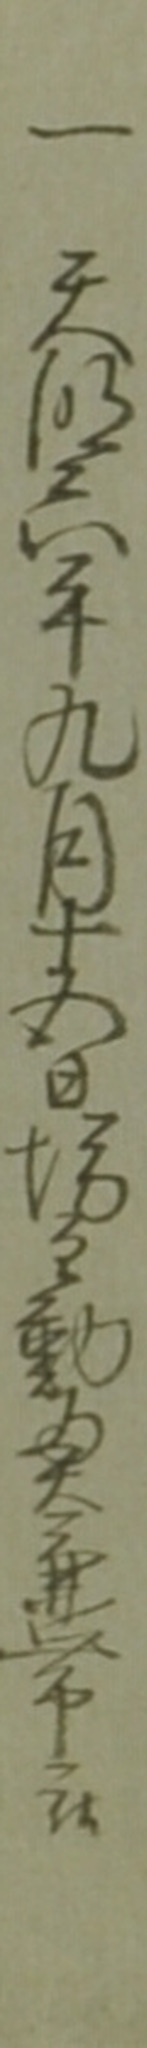一天明六午九月十五日坊主勤奥兼帯被
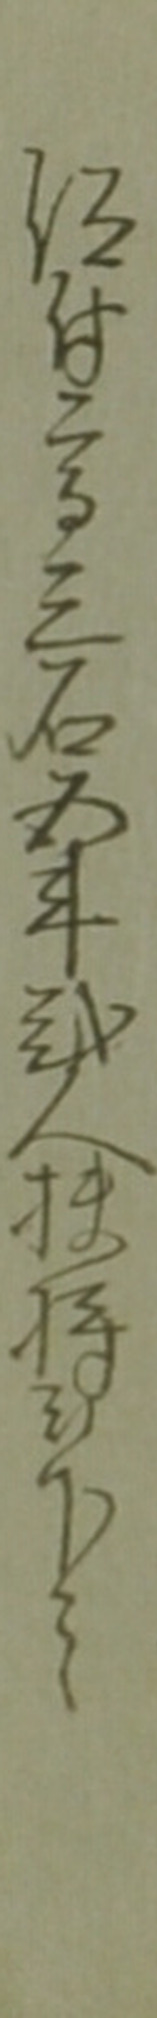仰付高三石五斗弐人扶持被下之
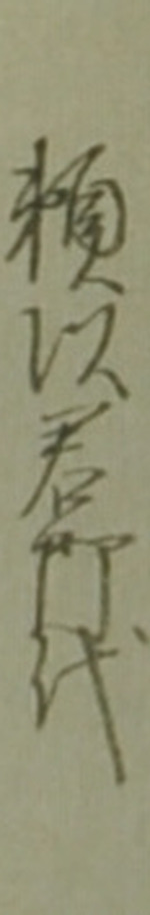頼以君御代
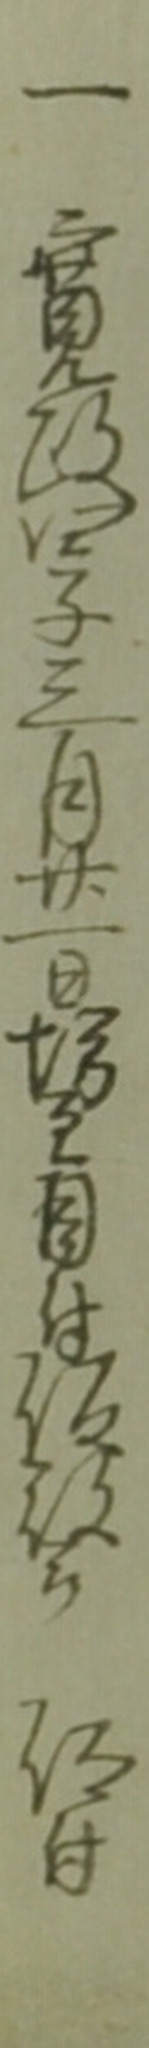一寛政四子三月廿一日坊主目付仮役被仰付
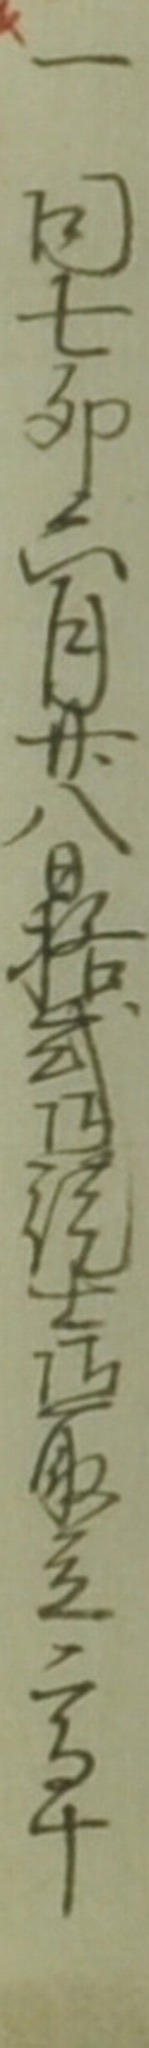一同七卯六月廿八日格式御徒士御取立高十

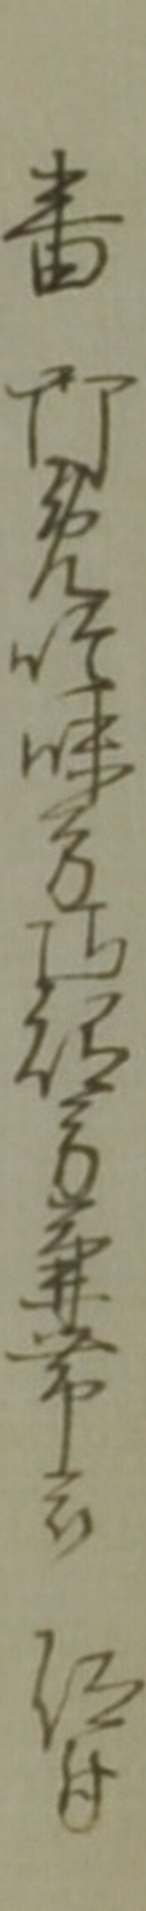番御免吟味方御賄方兼帯被仰付
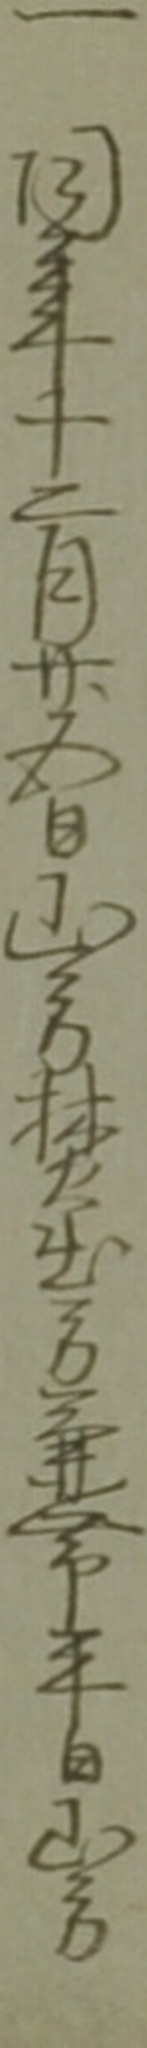一同年十二月廿五日山方焚出方兼帯平日山方

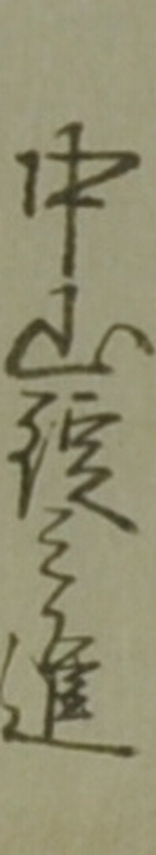中山錠之進
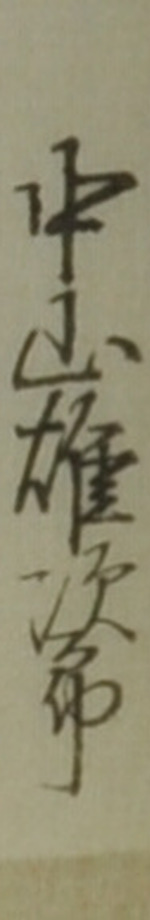中山雄次郎
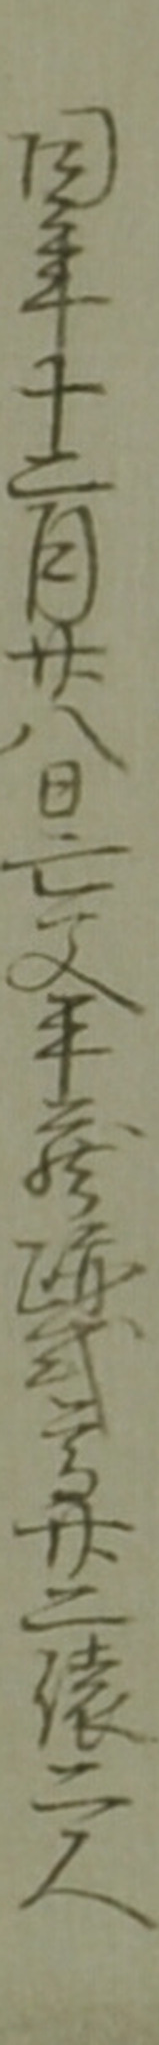一同年十二月廿八日亡父平蔵跡式高廿二俵二人

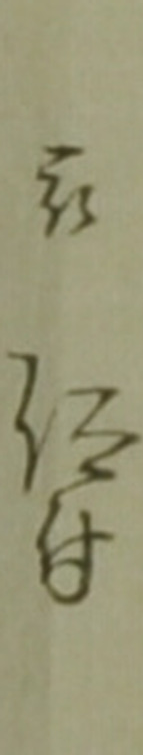被仰付
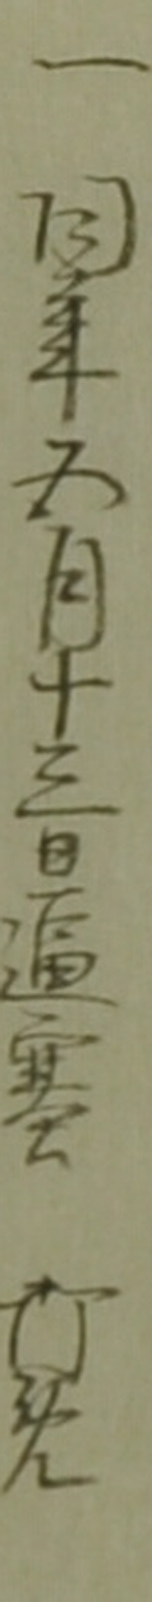一同年五月十三日逼塞御免

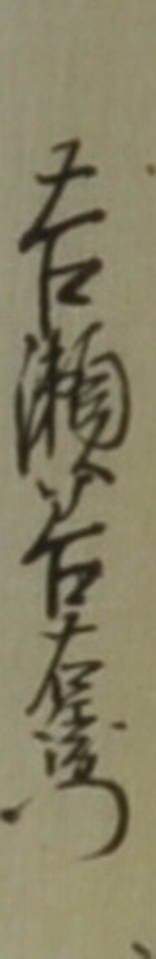吉瀬善右衛門

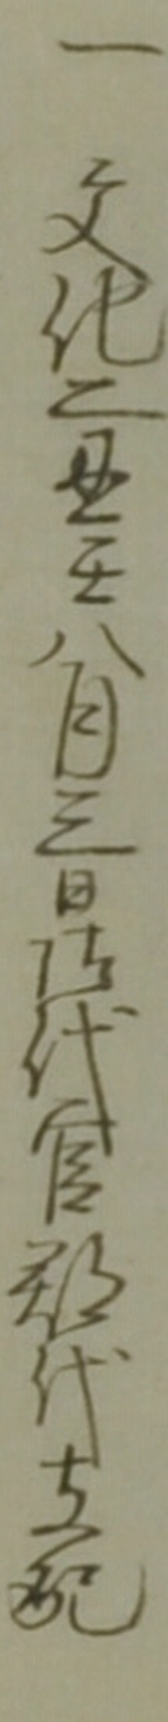一文化二丑閏八月三日御代官郡代支配
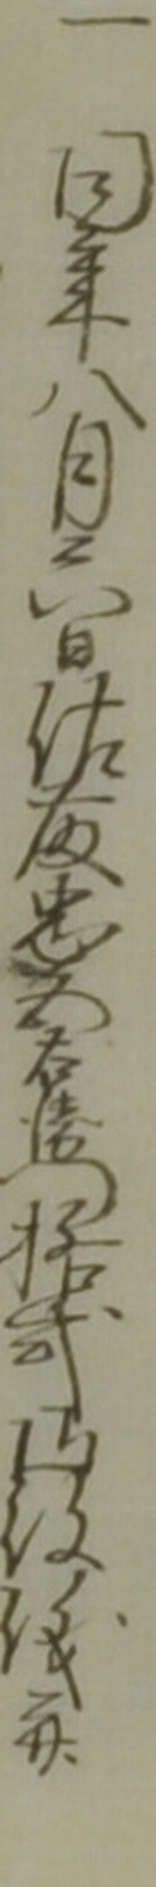一同年八月六日佐藤忠五右衛門格式御役儀并
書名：無足諸士勤仕録（三）
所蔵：伊那市立高遠町図書館・合同会社AMANE
